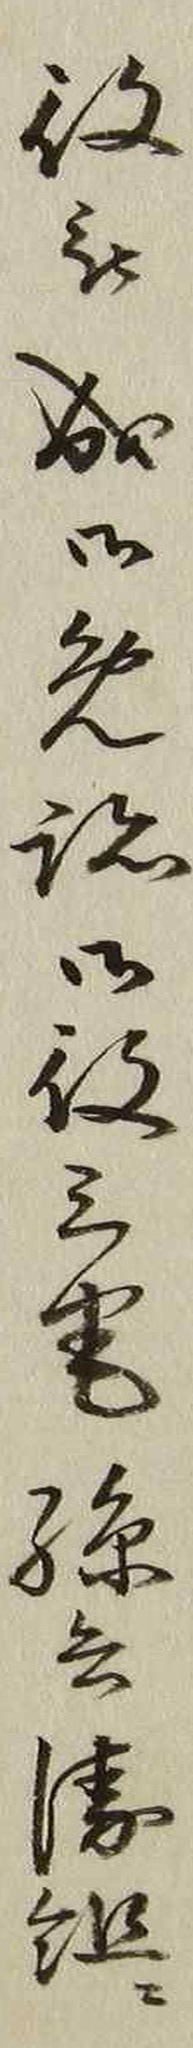役被成御免跡御役三宅孫兵衛組ニ
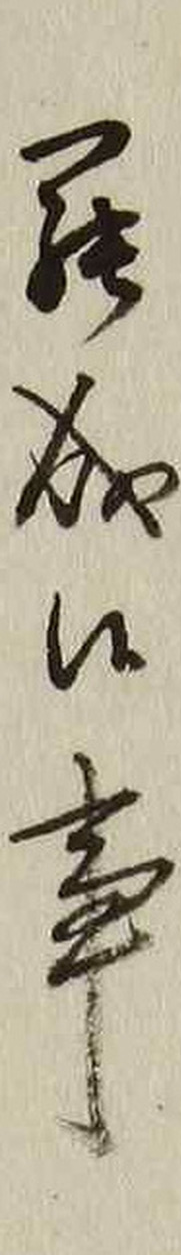罷成候事
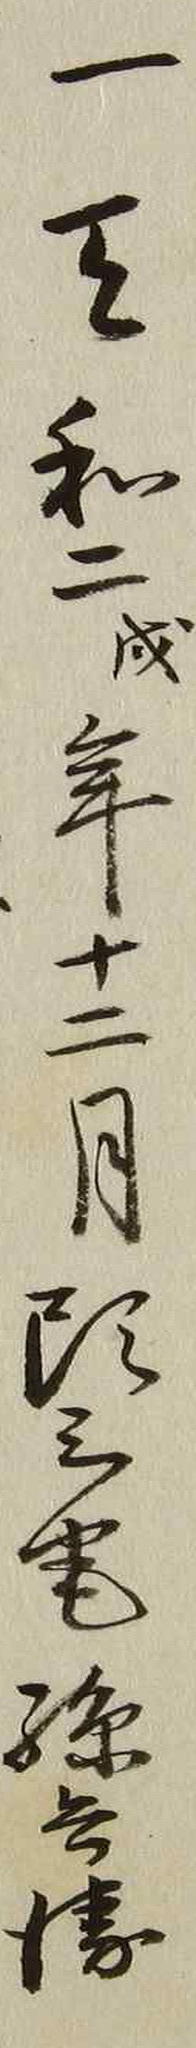一天和二戌年十二月頭三宅孫兵衛
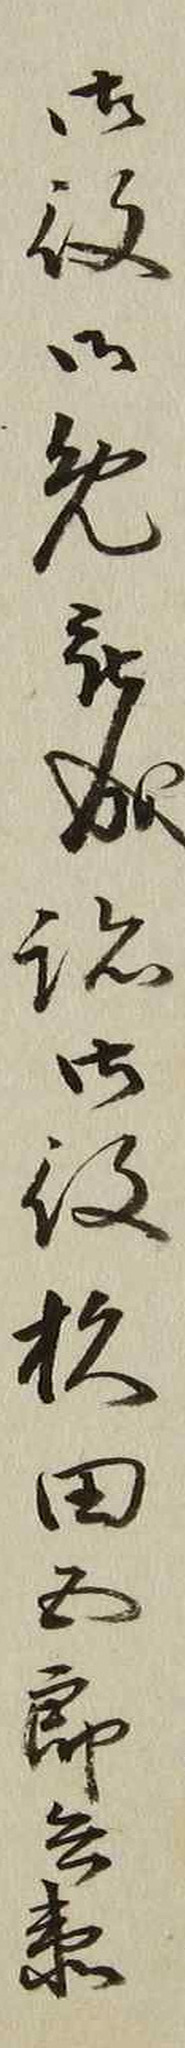御役御免被成跡御役杉田五郎兵衛
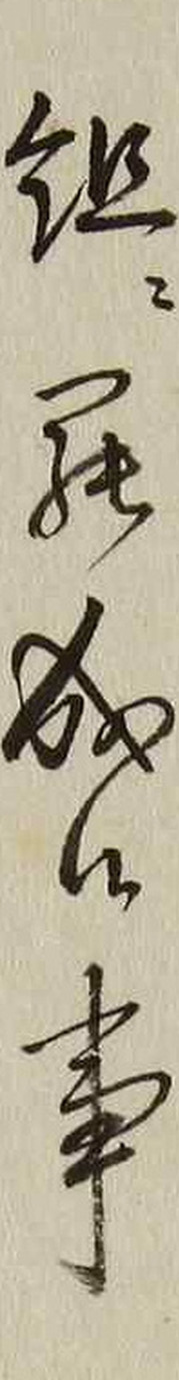組ニ罷成候事
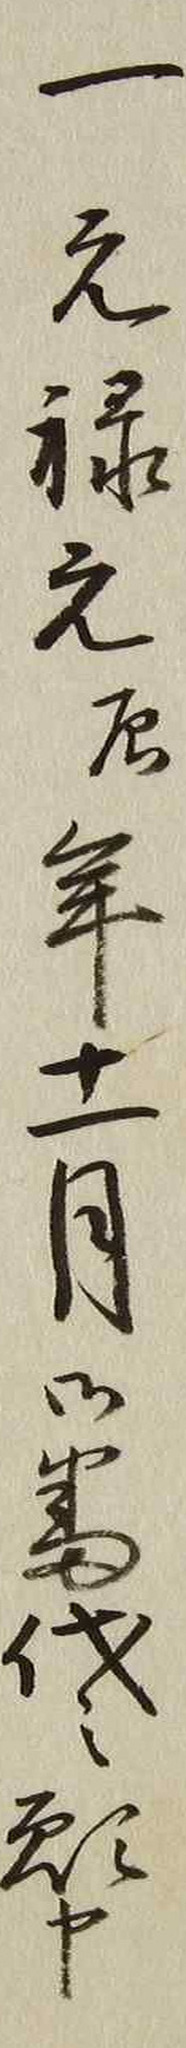一元禄元辰年十一月御番代之願申
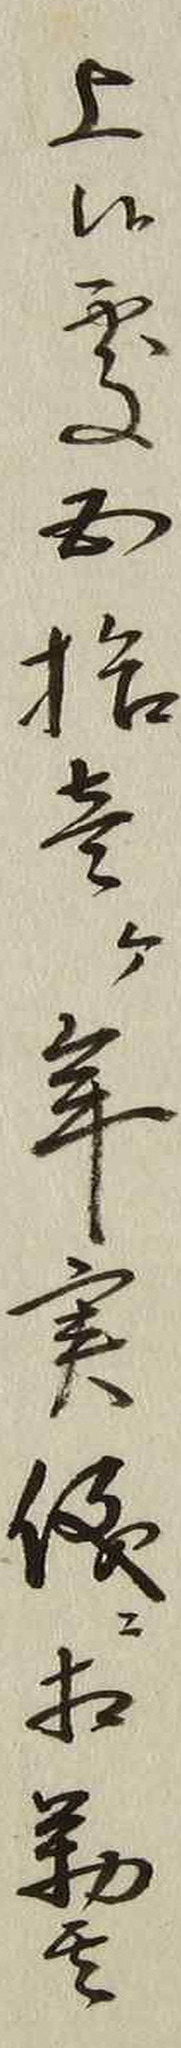上候処五拾壱ケ年実儀ニ相勤其
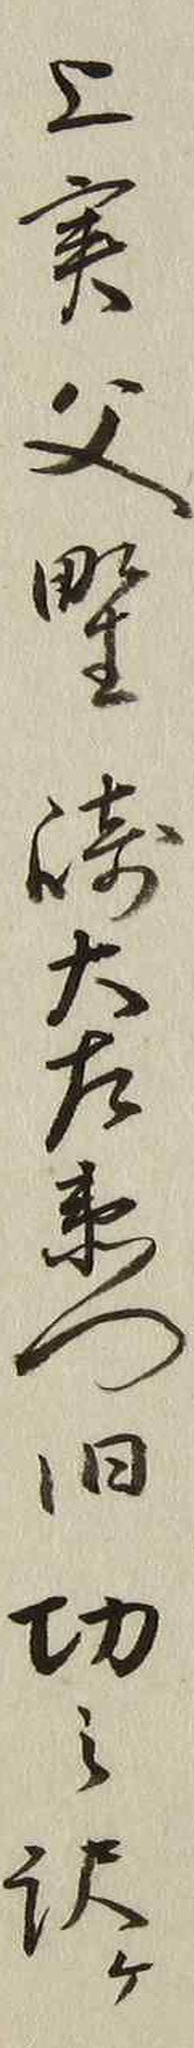上実父野崎大左衛門旧功之訳ケ
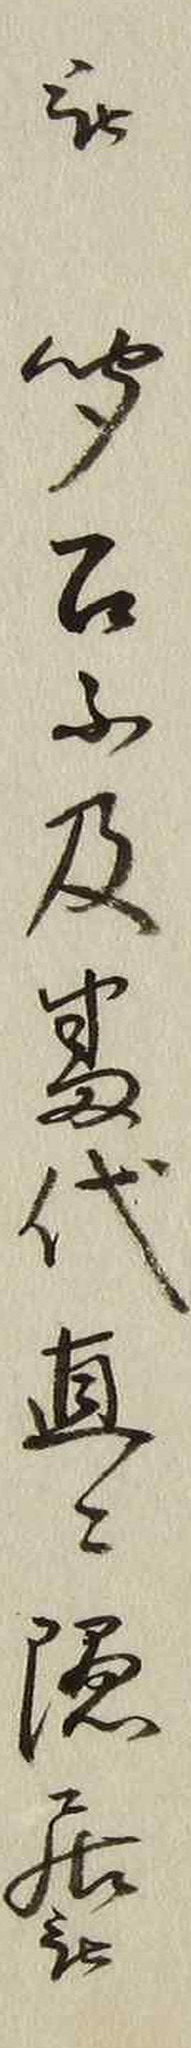被聞召不及番代直ニ隠居被
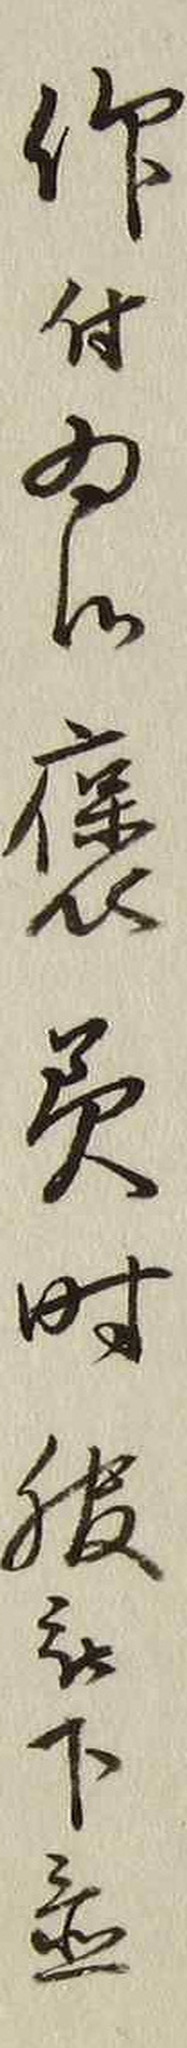仰付為御褒美時服被下置
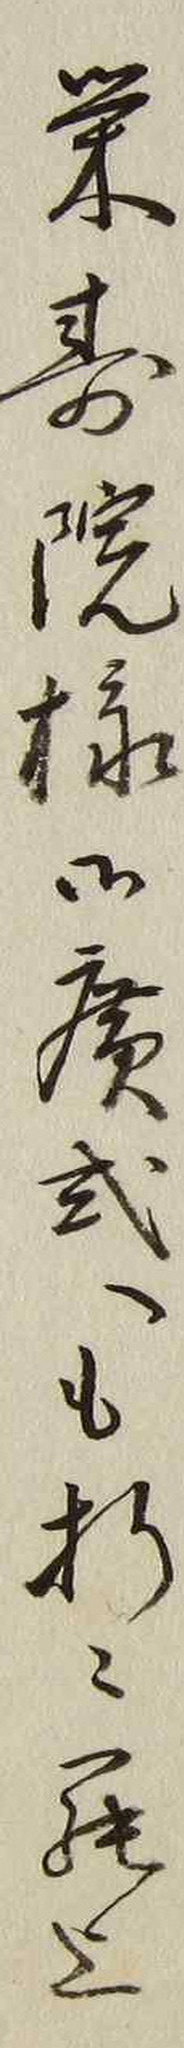栄寿院様御広式へも折々罷上
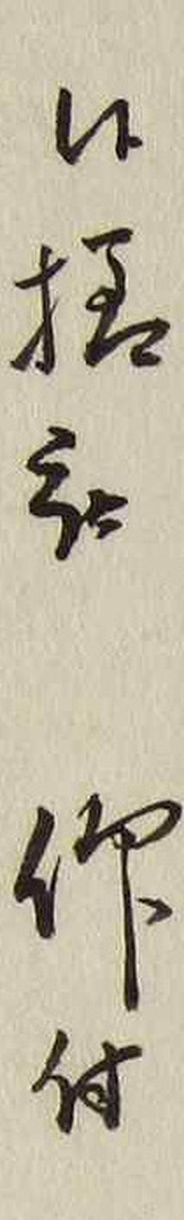候様被仰付
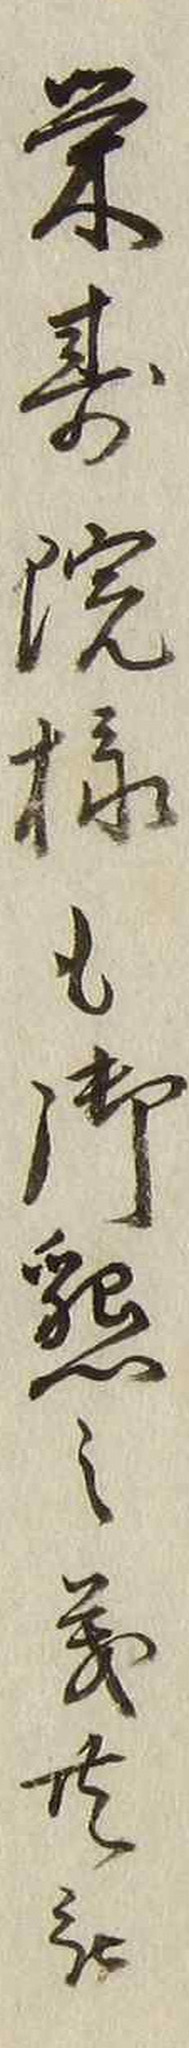栄寿院様も御懇之義共被
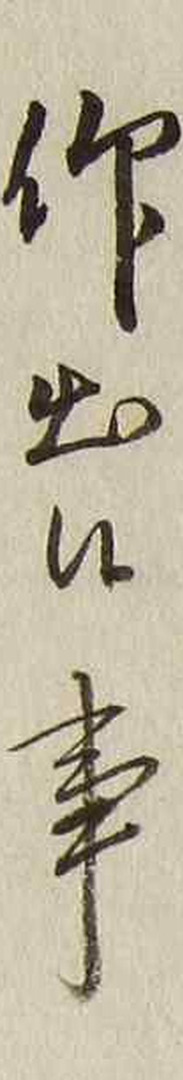仰出候事

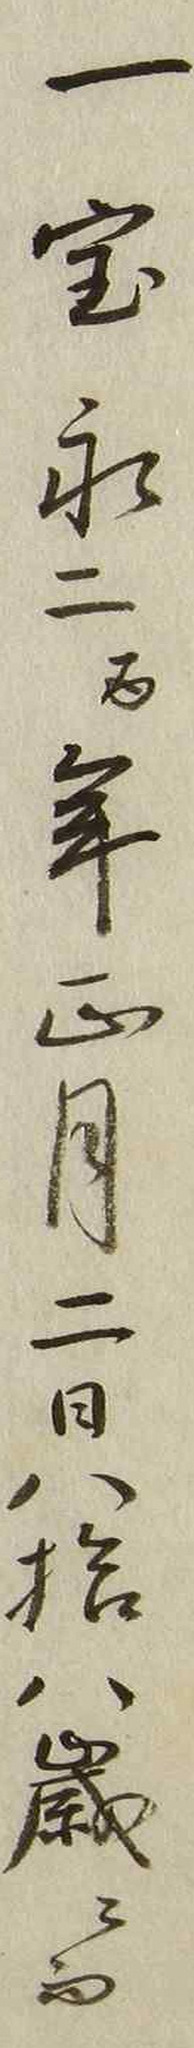一宝永二西年正月二日八拾八歳ニ而
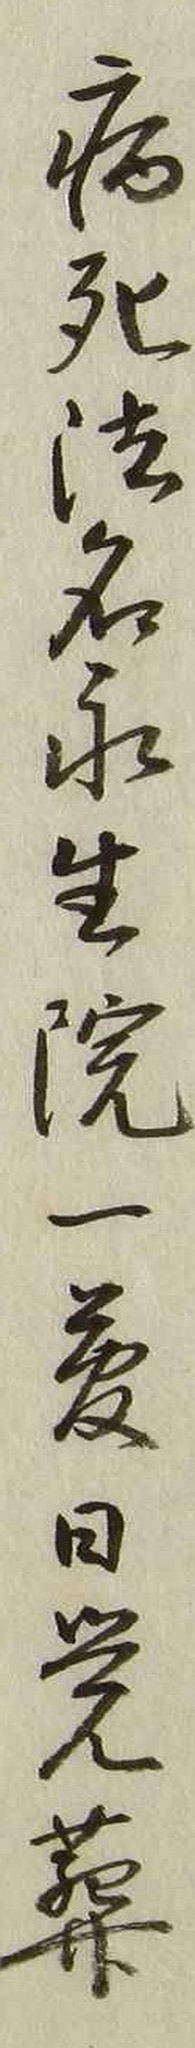病死法名永生院一夢日覚葬
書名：諸士系譜　巻之149　そ之部2
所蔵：会津若松市立会津図書館
